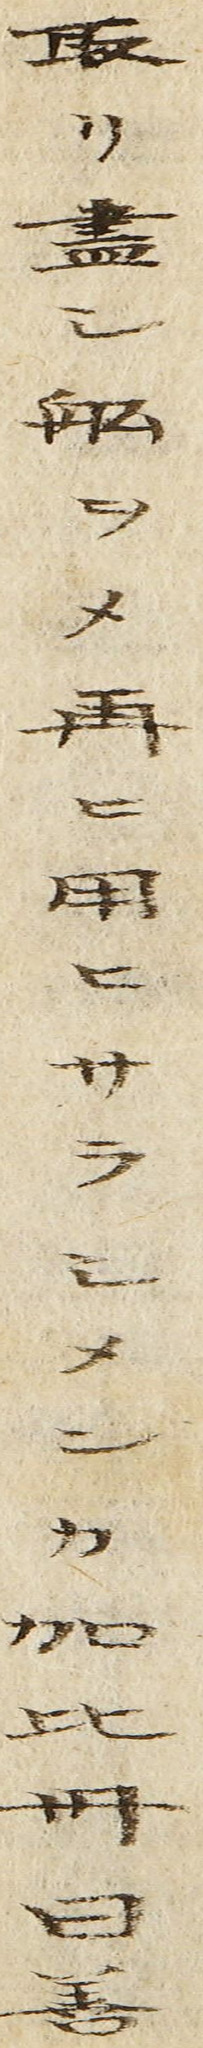取リ尽シ船ヲシテ再ヒ用ヒサラシメンカ加比丹曰善
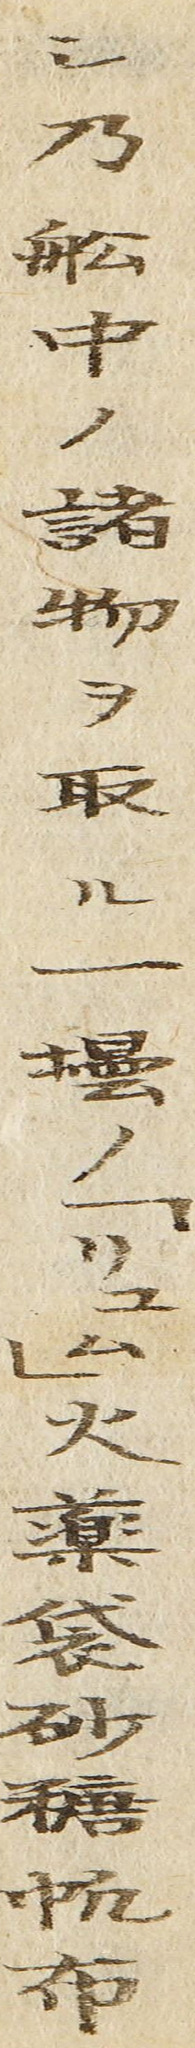シ乃船中ノ諸物ヲ取ル一壜ノ「リュム」火薬袋砂糖帆布
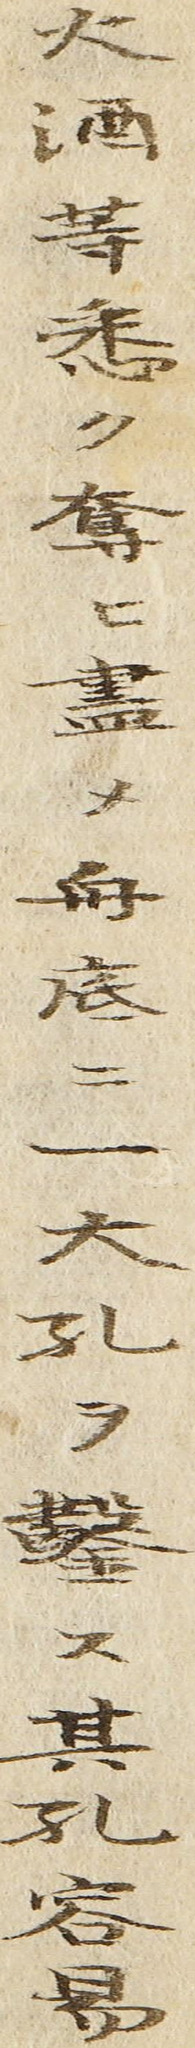火酒等悉ク奪ヒ尽シテ舟底ニ一大孔ヲ鑿ス其孔容易
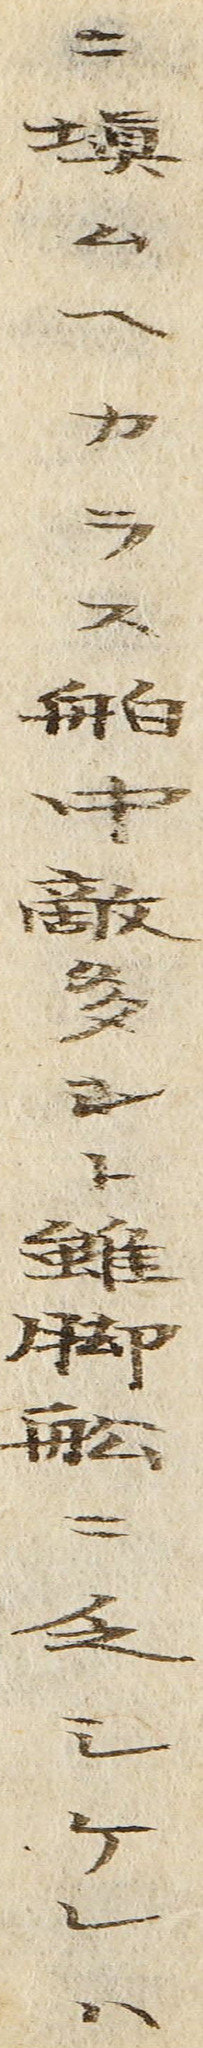ニ填ムヘカラス舶中敵多シト雖脚船ニ乏シケレハ
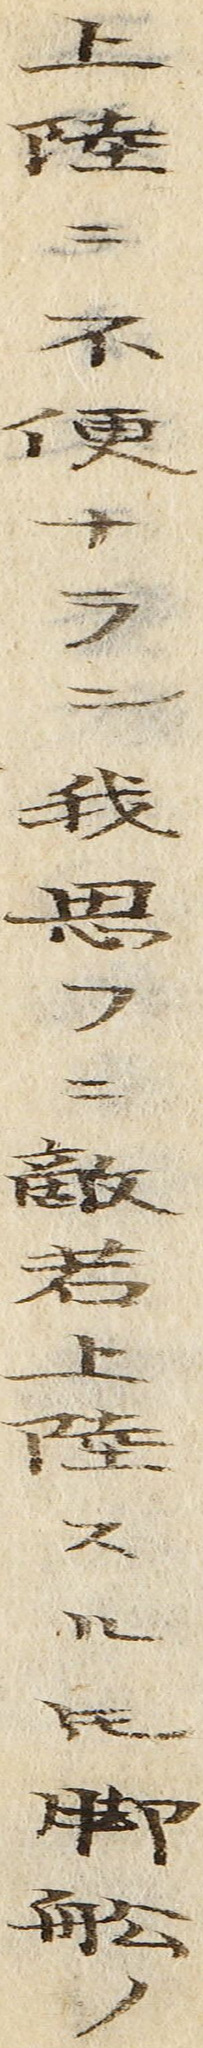上陸ニ不便ナラン我思フニ敵若上陸スルトモ脚船ノ
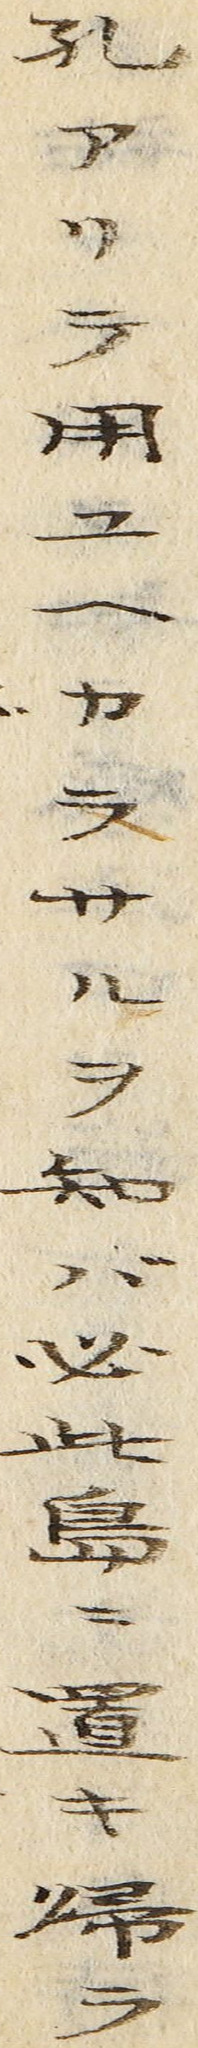孔アリテ用ユヘカラサルヲ知バ必此島ニ置キ帰ラ
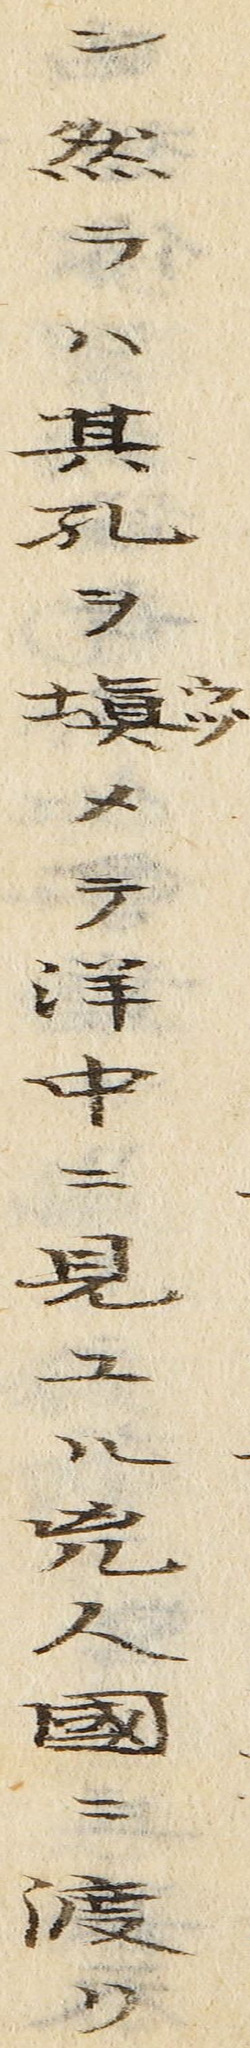ン然ラハ其孔ヲ填メテ洋中ニ見ユル兇人国ニ渡リ
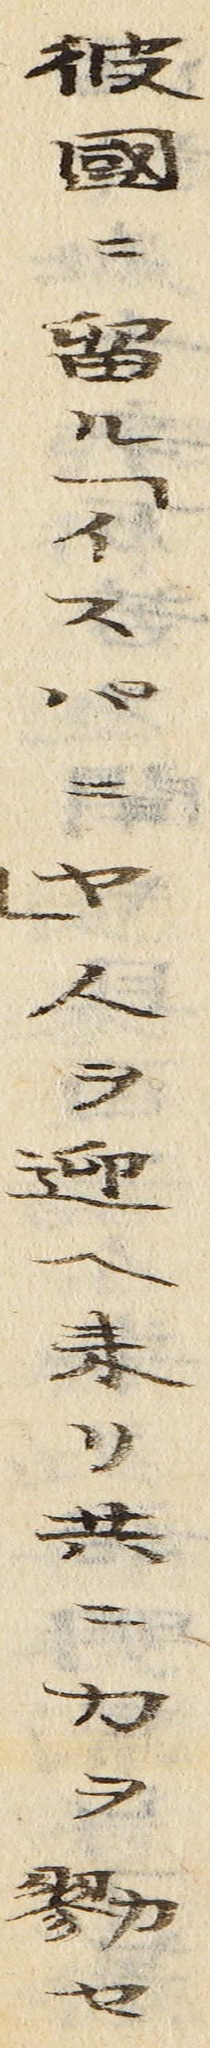彼国ニ留ル「イスパニヤ」人ヲ迎ヘ来リ共ニ力ヲ勠セ
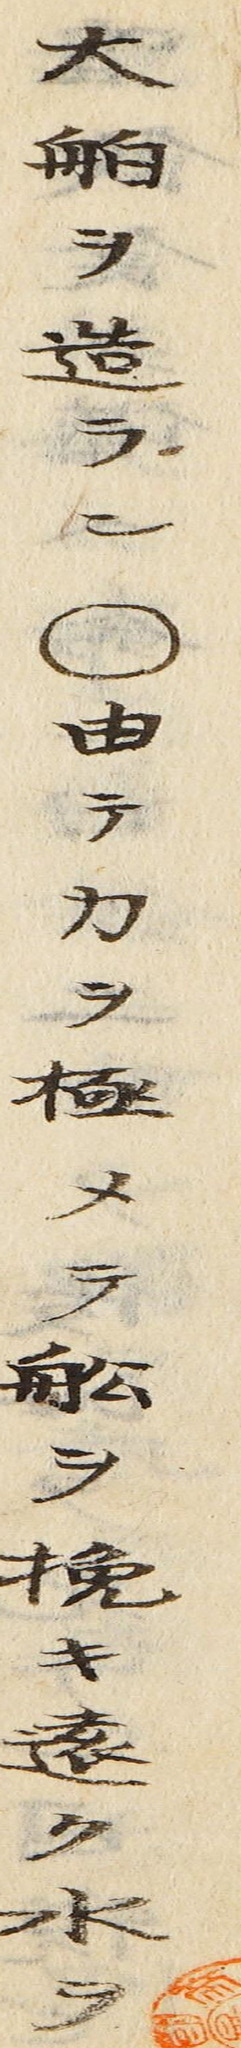大舶ヲ造ラン◯由テ力ヲ極メテ船ヲ挽キ遠ク水ヲ
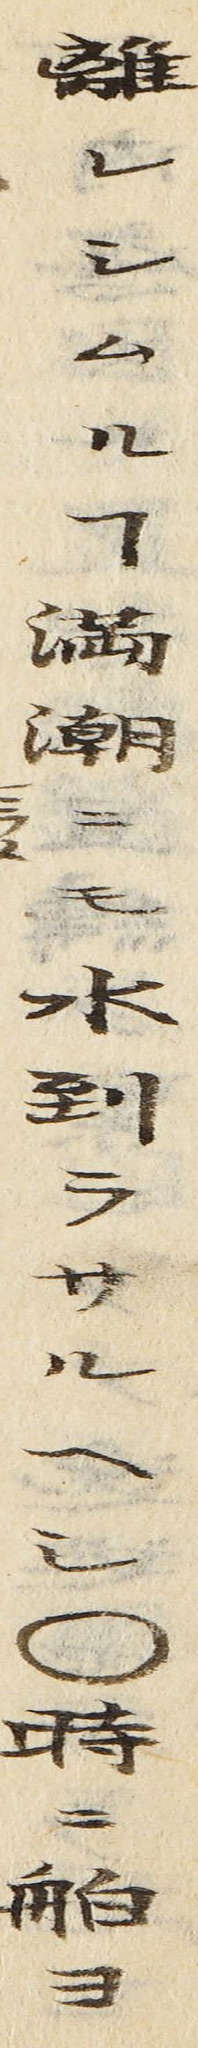離レシムルコト満潮ニモ水到ラサルヘシ◯時ニ舶ヨ
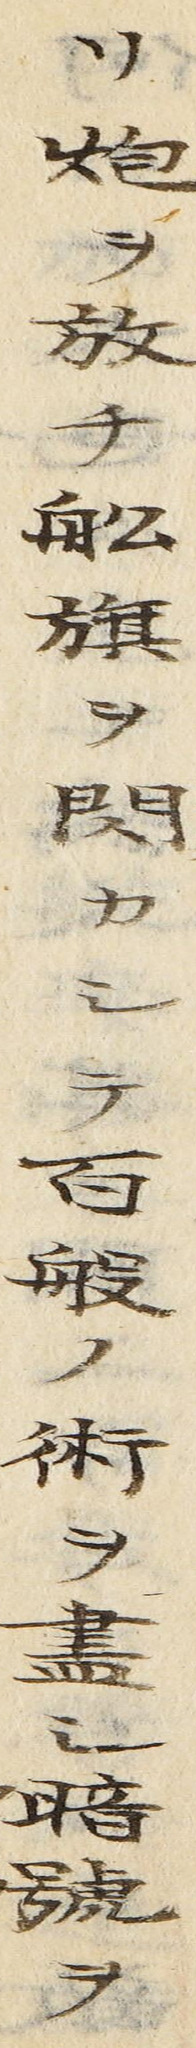リ炮ヲ放チ船旗ヲ閃カシテ百般ノ術ヲ尽シ暗号ヲ
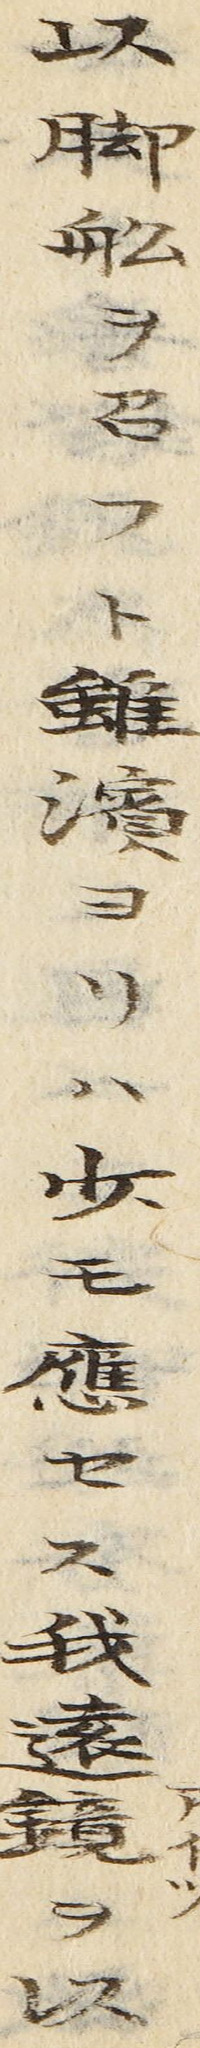以脚船ヲ召フト雖浜ヨリハ少モ応セス我遠鏡ヲ以
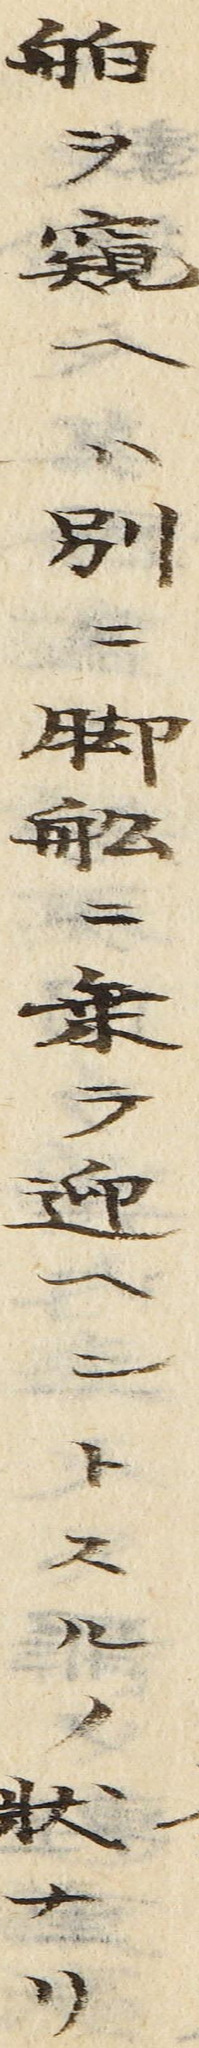舶ヲ窺ヘハ別ニ脚船ニ乗テ迎ヘントスルノ状ナリ
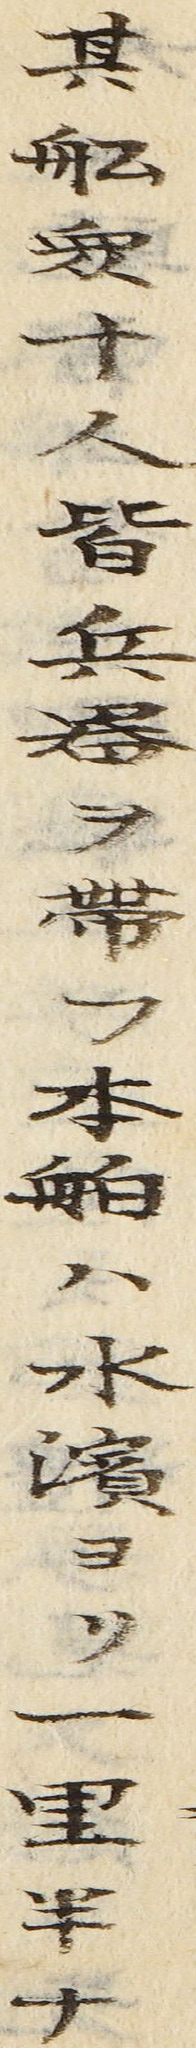其船衆十人皆兵器ヲ帯フ本舶ハ水浜ヨリ一里半ナ
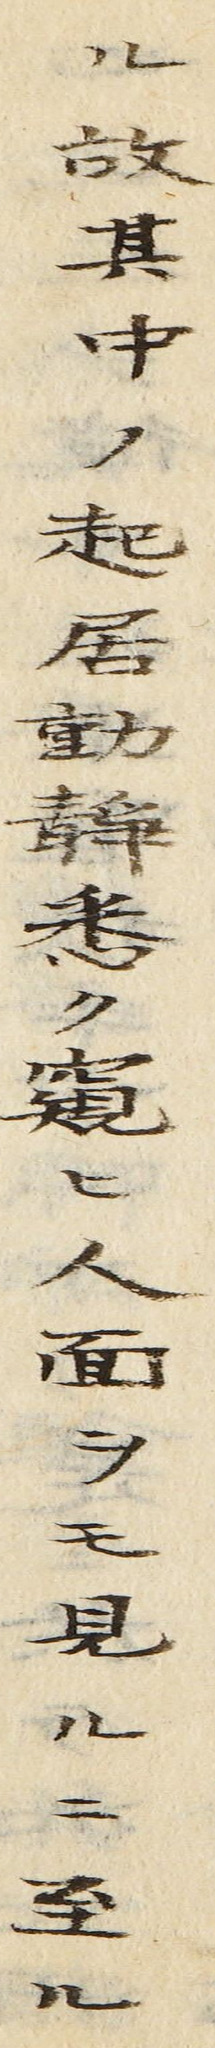ル故其中ノ起居動静悉ク窺ヒ人面ヲモ見ルニ至ル
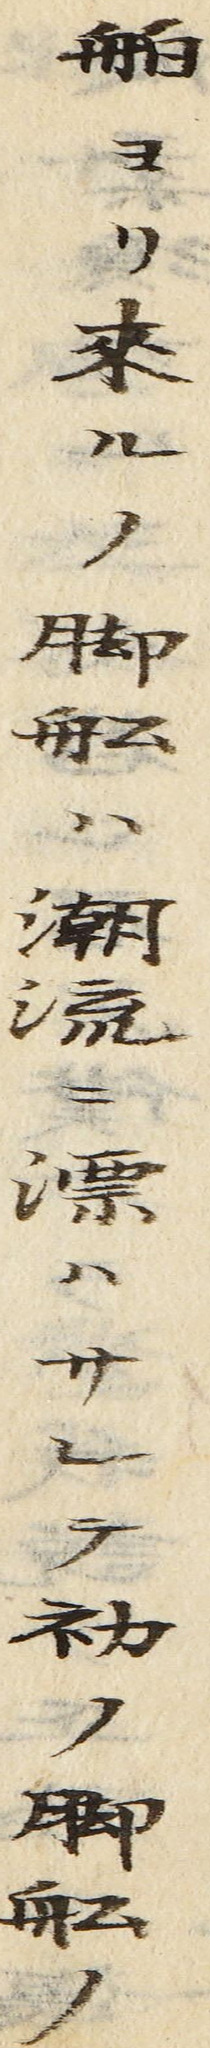舶ヨリ来ルノ脚船ハ潮流ニ漂ハサレテ初ノ脚船ノ
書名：漂流紀事
